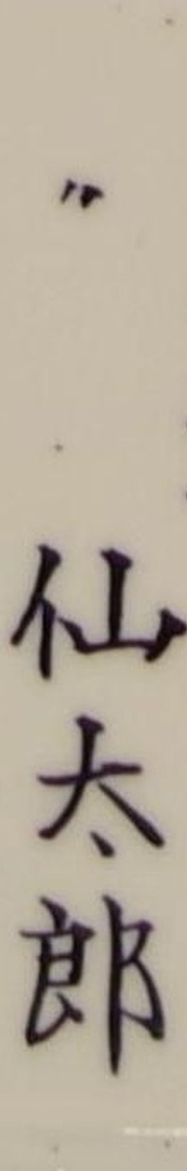仙太郎
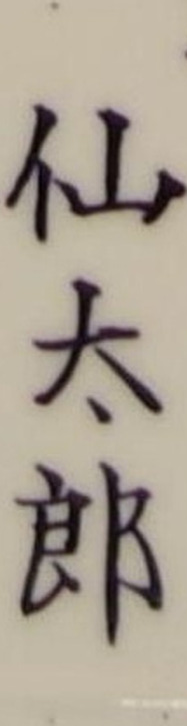仙太郎
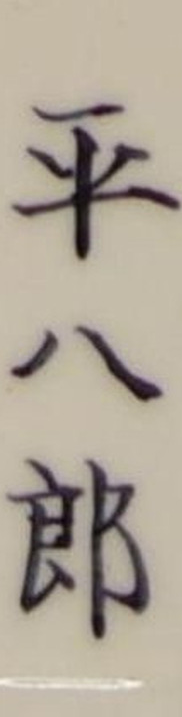平八郎
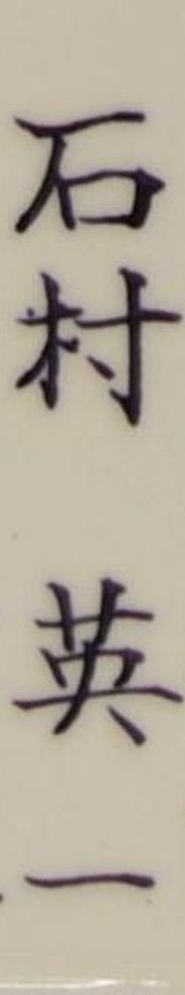石村英一
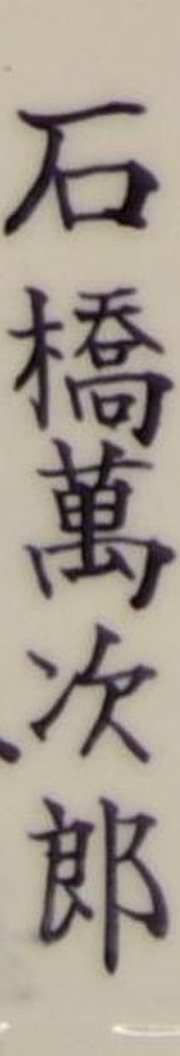石橋萬次郎
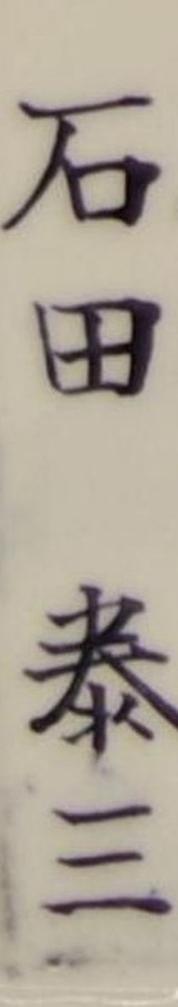石田泰三

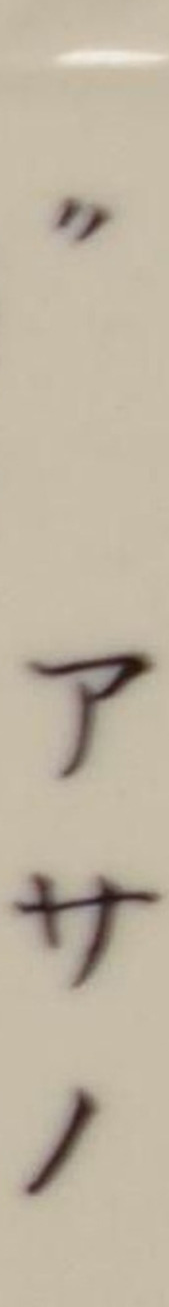アサノ
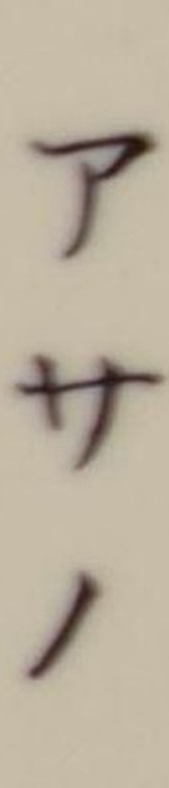アサノ
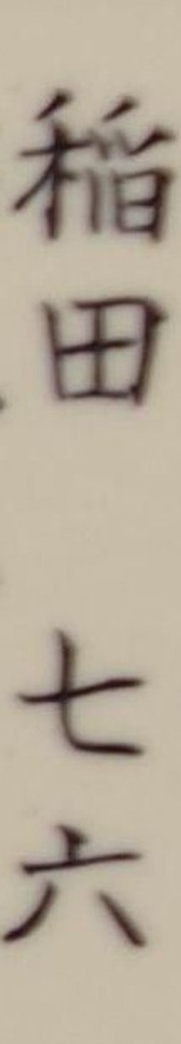稲田七六
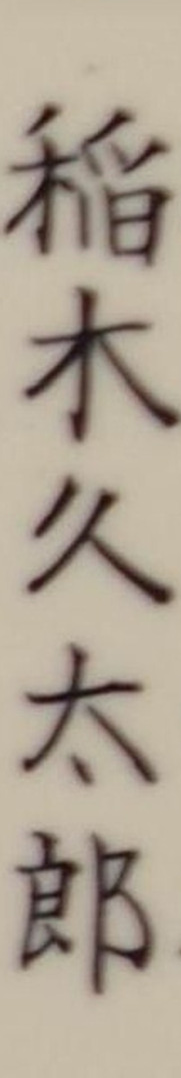稲木久太郎
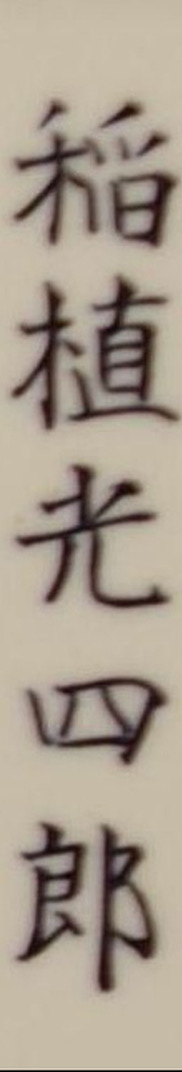稲植光四郎
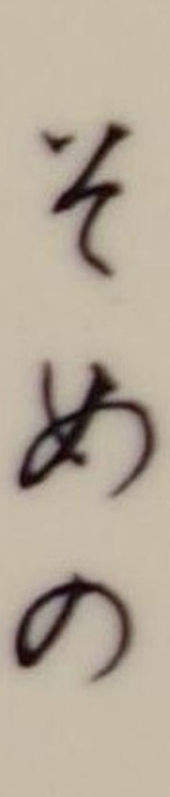そめの
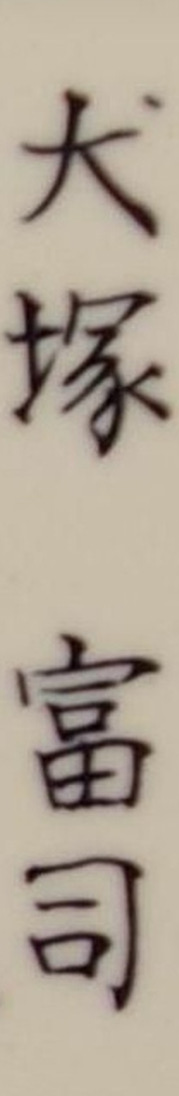大塚富司
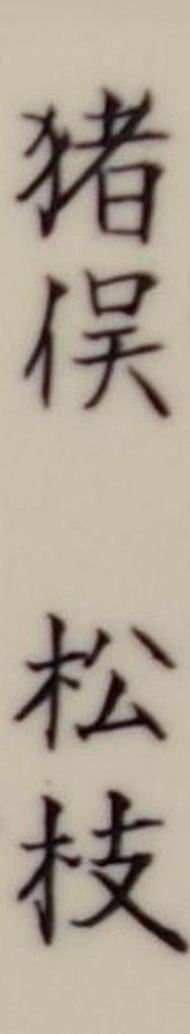猪俣松枝
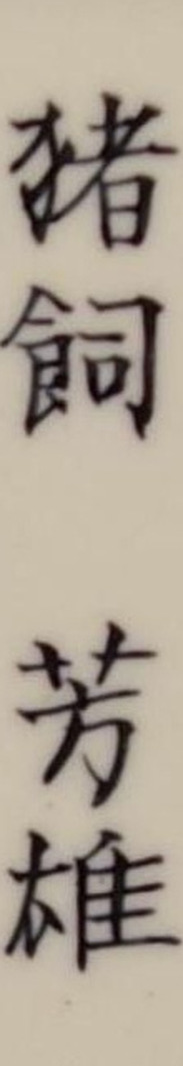猪飼芳雄
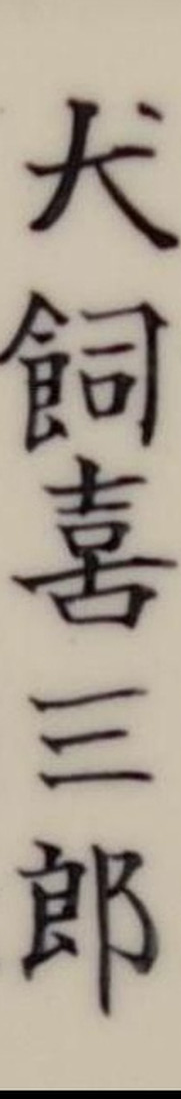犬飼喜三郎
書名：M~S
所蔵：高野山金剛峯寺
